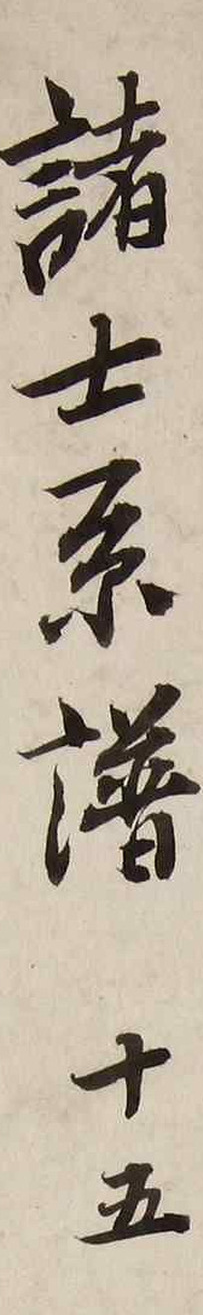諸士系譜十五

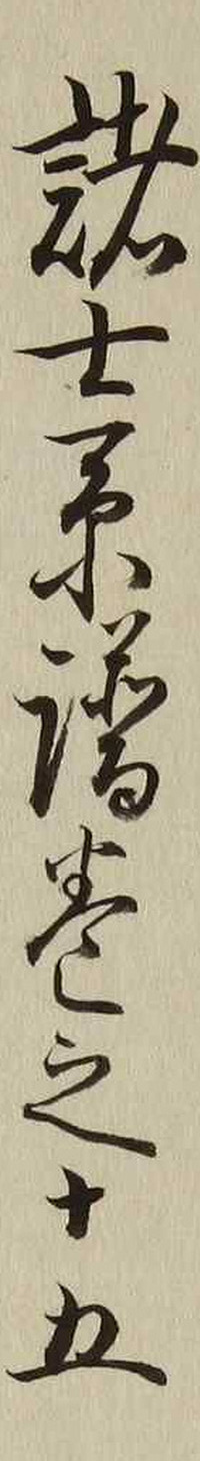諸士系譜巻之十五
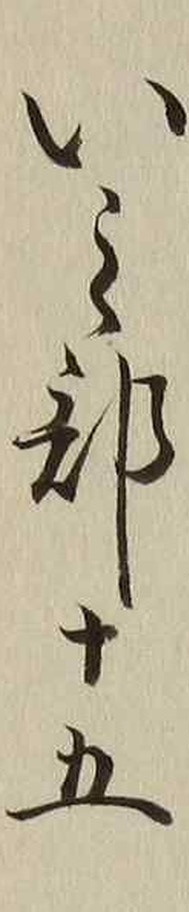い之部十五
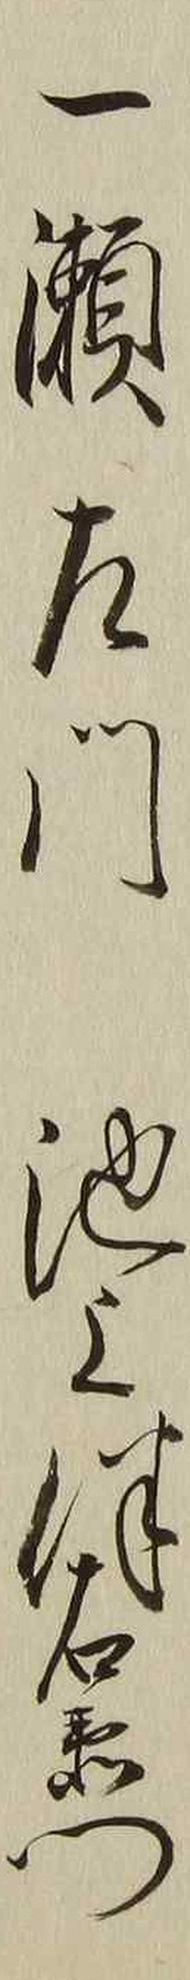一瀬左門池上伴右衛門

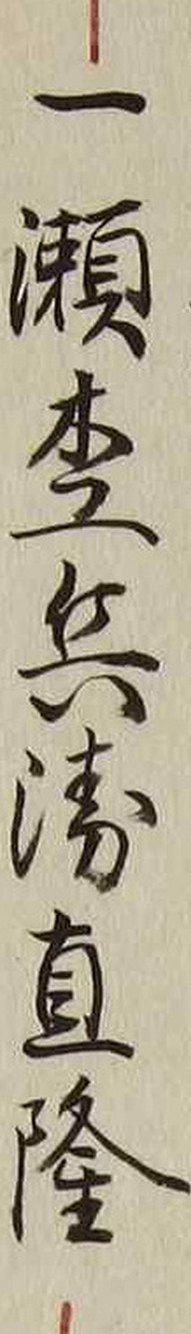一瀬杢兵衛直隆
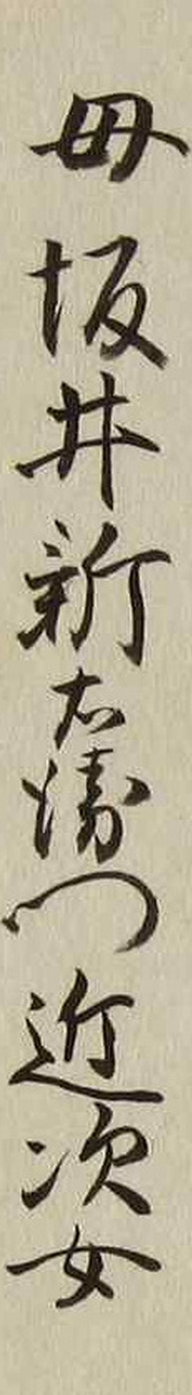母坂井新右衛門近次女
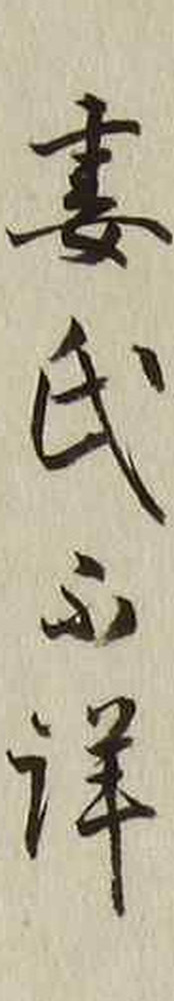妻氏不詳
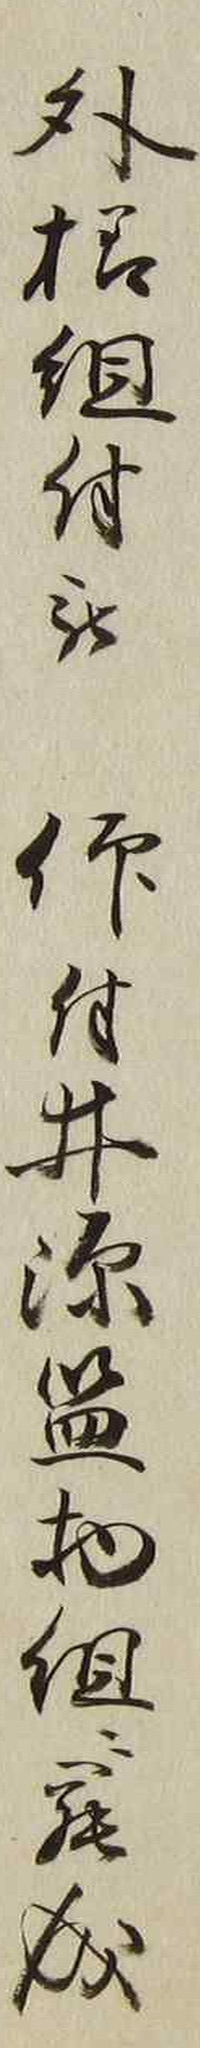外様組付被仰付井深監物組ニ罷成
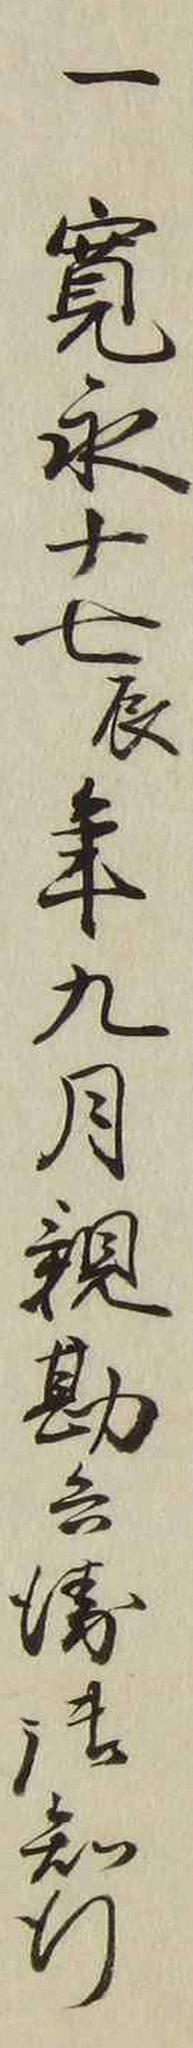一寛永十七辰年九月親勘兵衛御知行

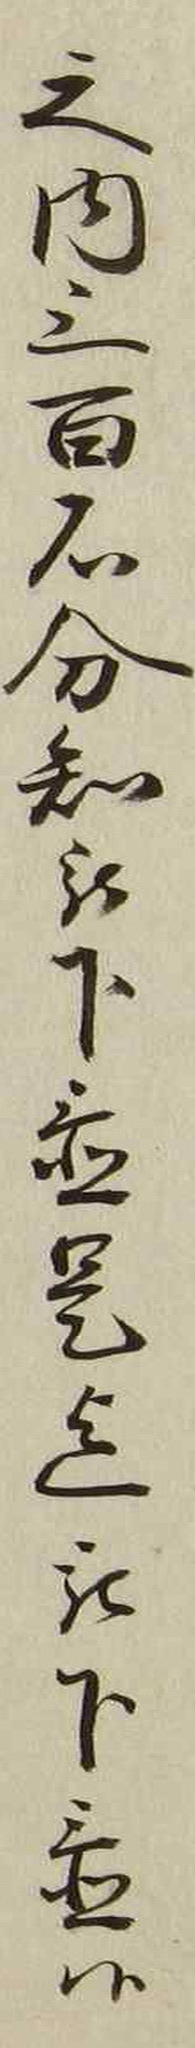之内三百石分知被下置是迄被下置候
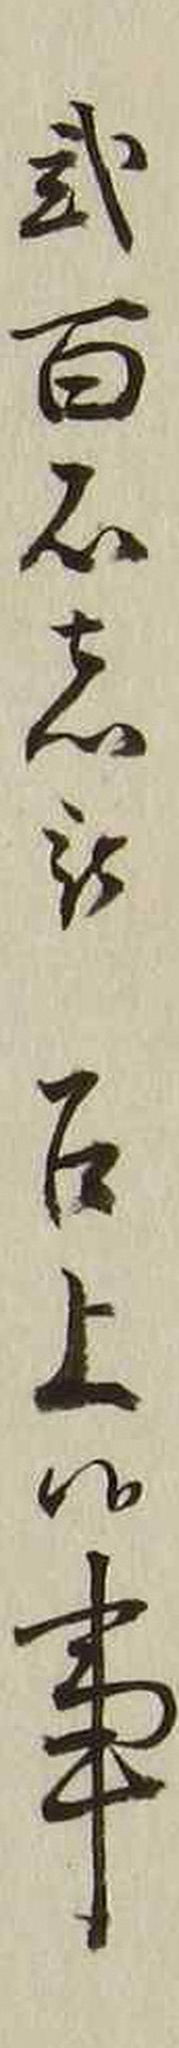弐百石者被召上候事
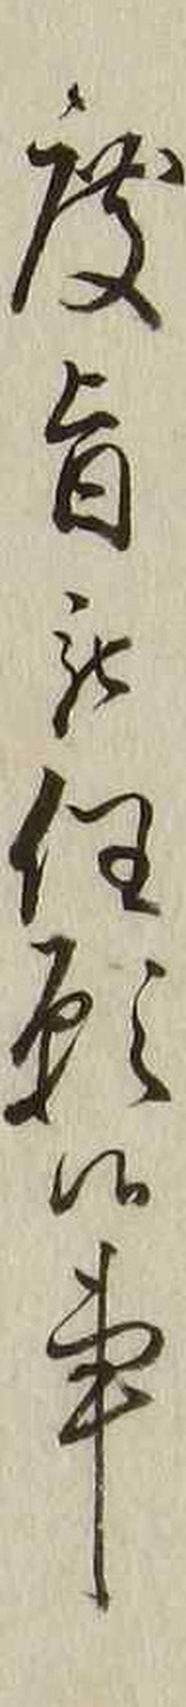度旨被任願候事
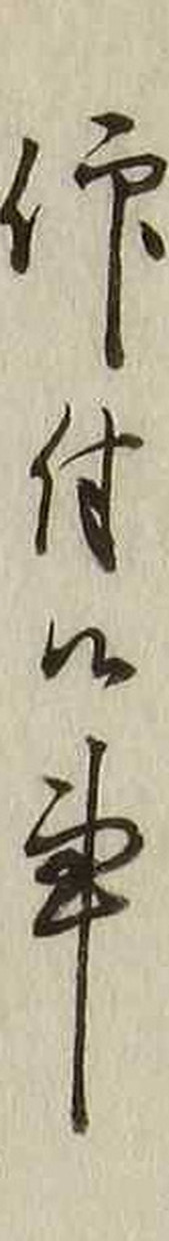仰付候事
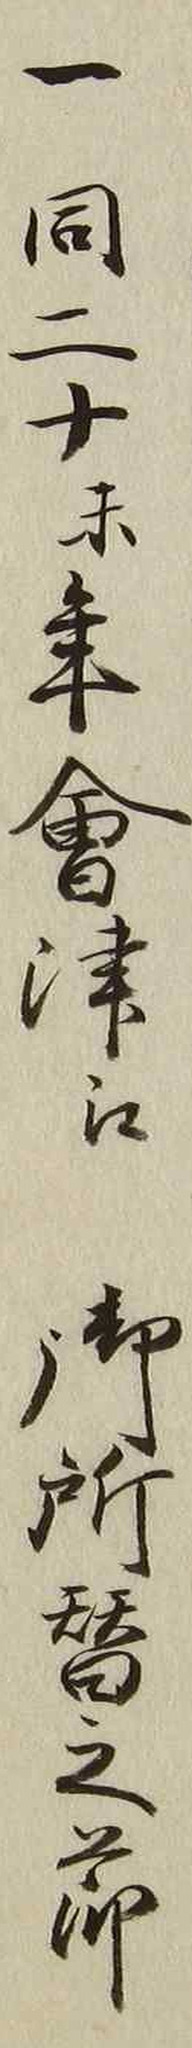一同二十未年会津江御所替之節
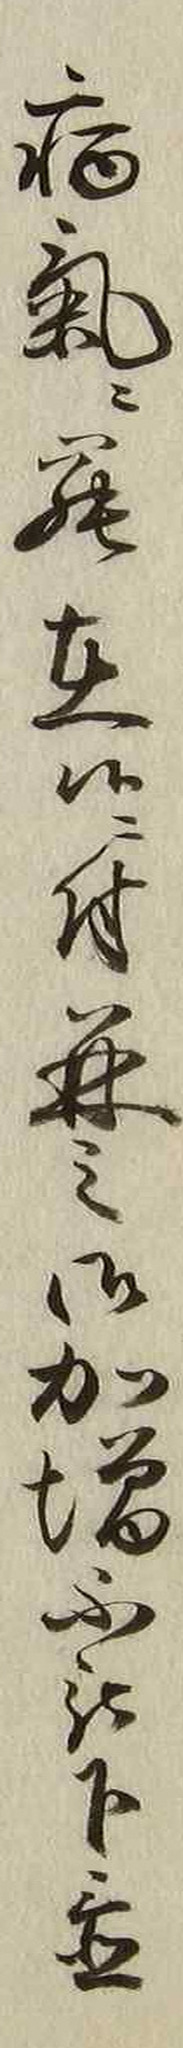病気ニ罷在候付ニ再之御加増不被下置
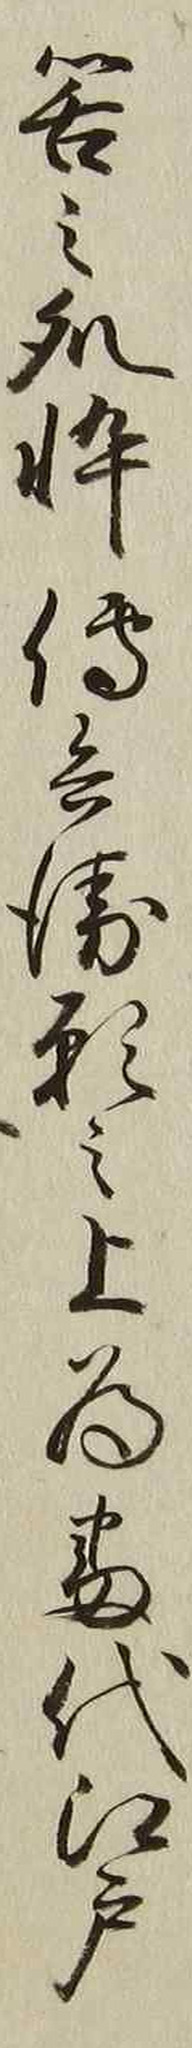筈之処忰伝兵衛願之上為番代江戸
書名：諸士系譜　巻之15　い之部15
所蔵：会津若松市立会津図書館
